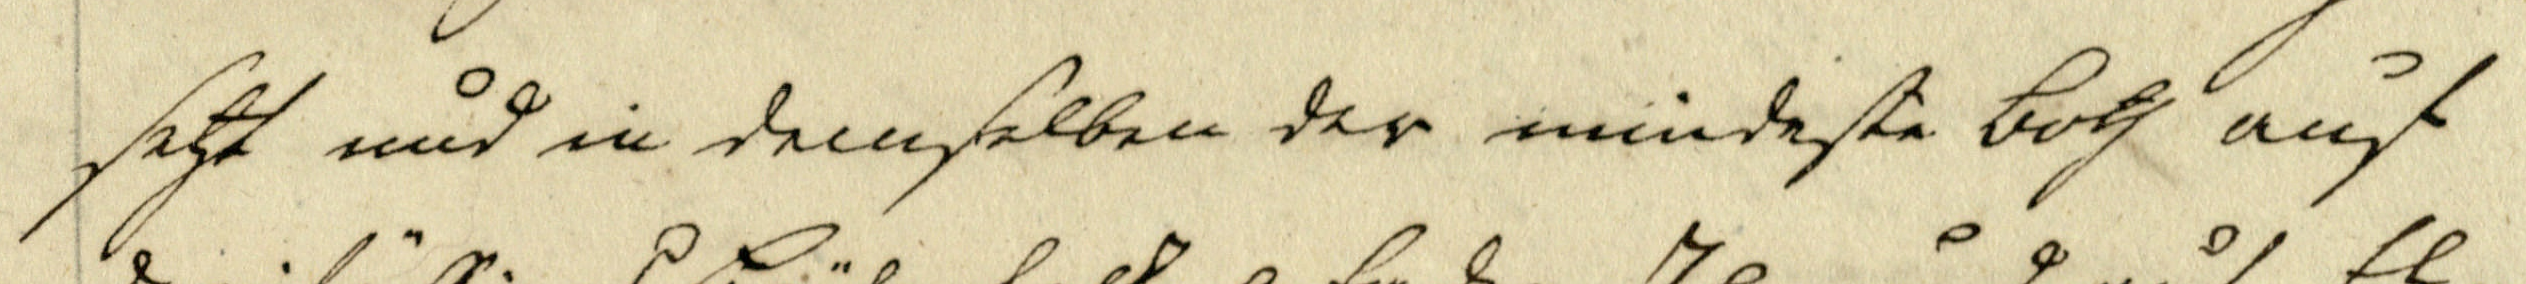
setzt und in demselben der mindeste Both auf
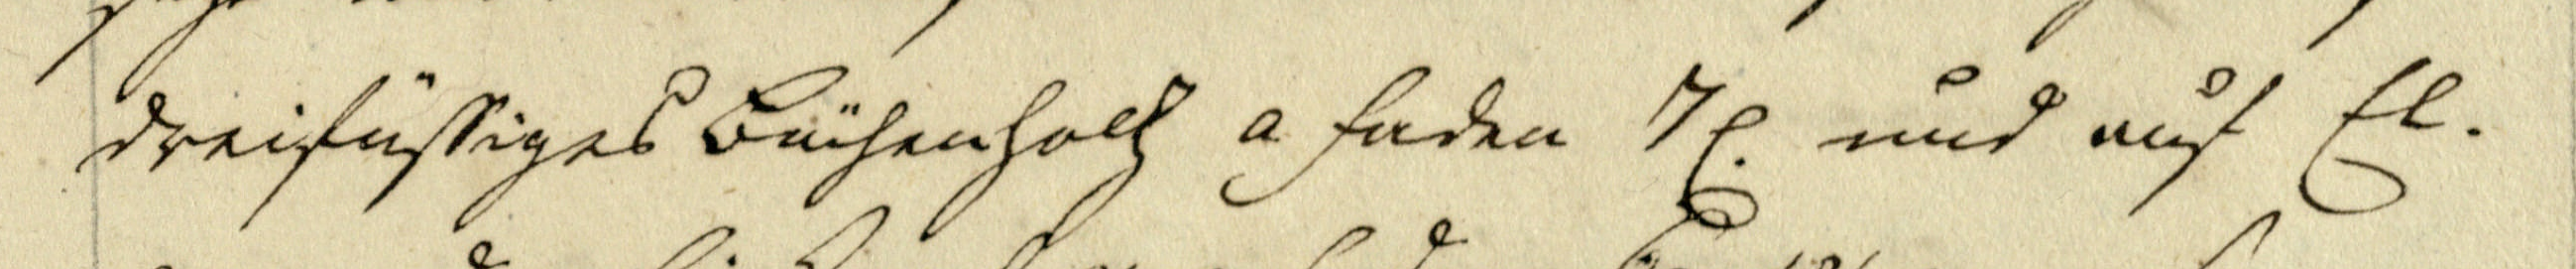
dreifüssiges Büchenholz a Faden 7 l. und auf El¬
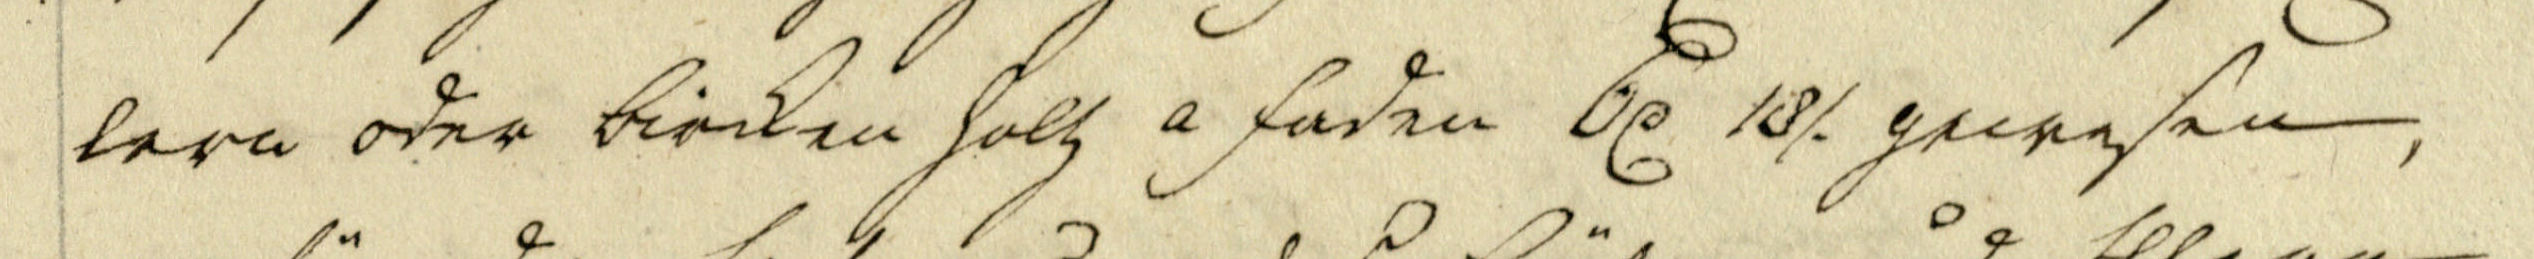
lern oder Bircken Holz a Faden 6 l. 18 s. gewesen,
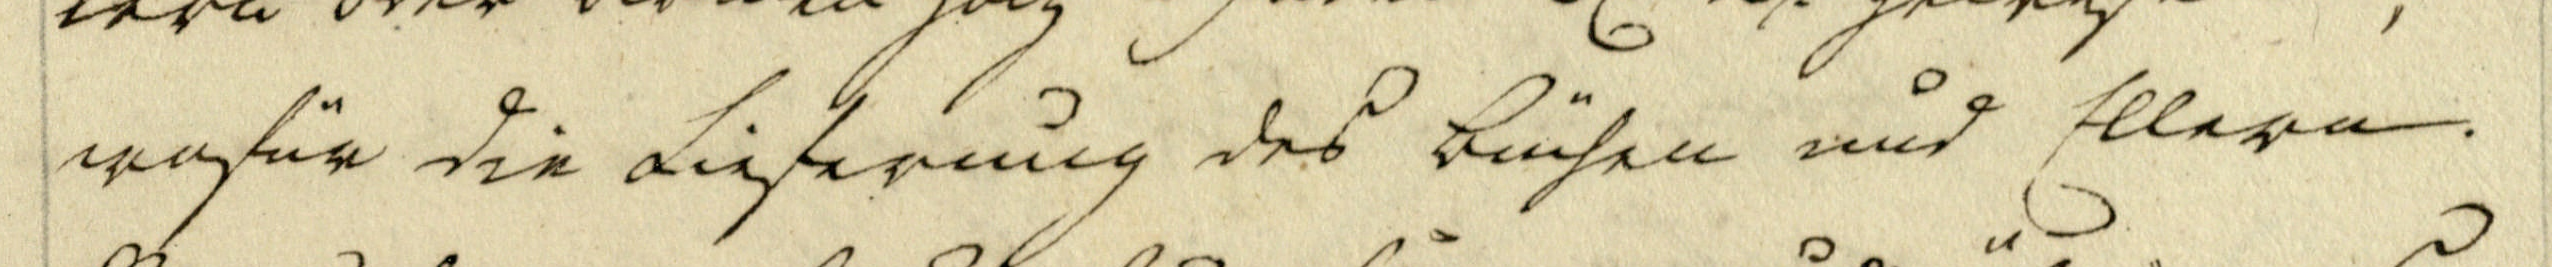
wofür die Lieferung des Büchen und Ellern¬
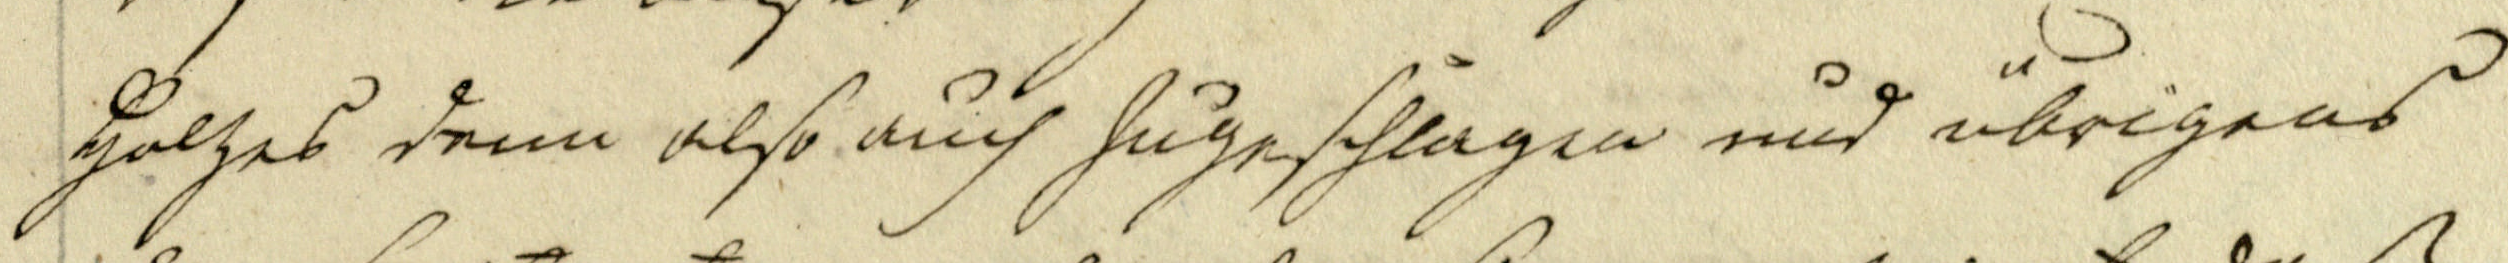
Holzes denn also auch zugeschlagen und übrigens
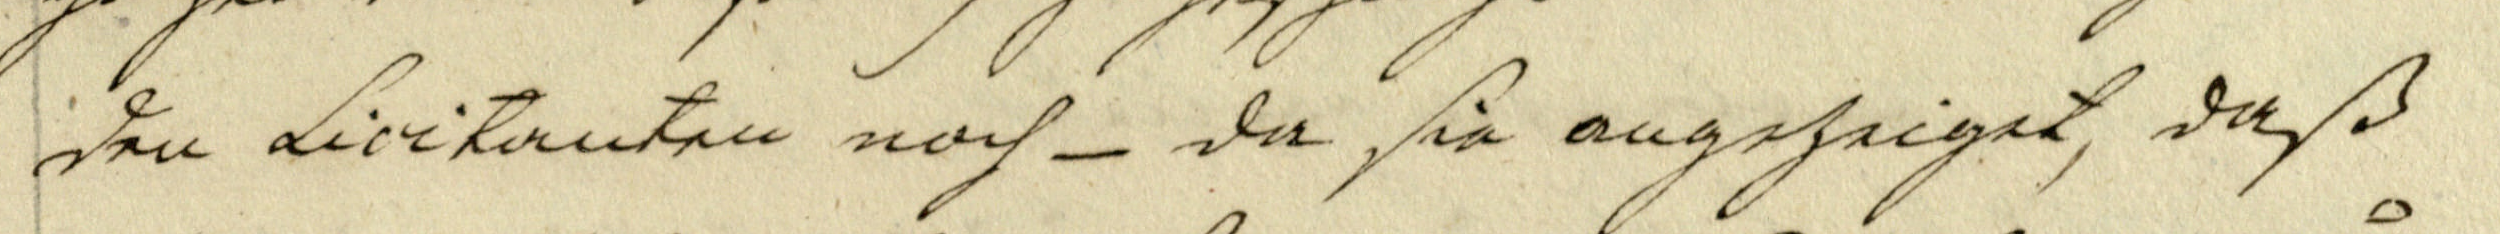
den Licitanten noch da sie angezeiget, daß
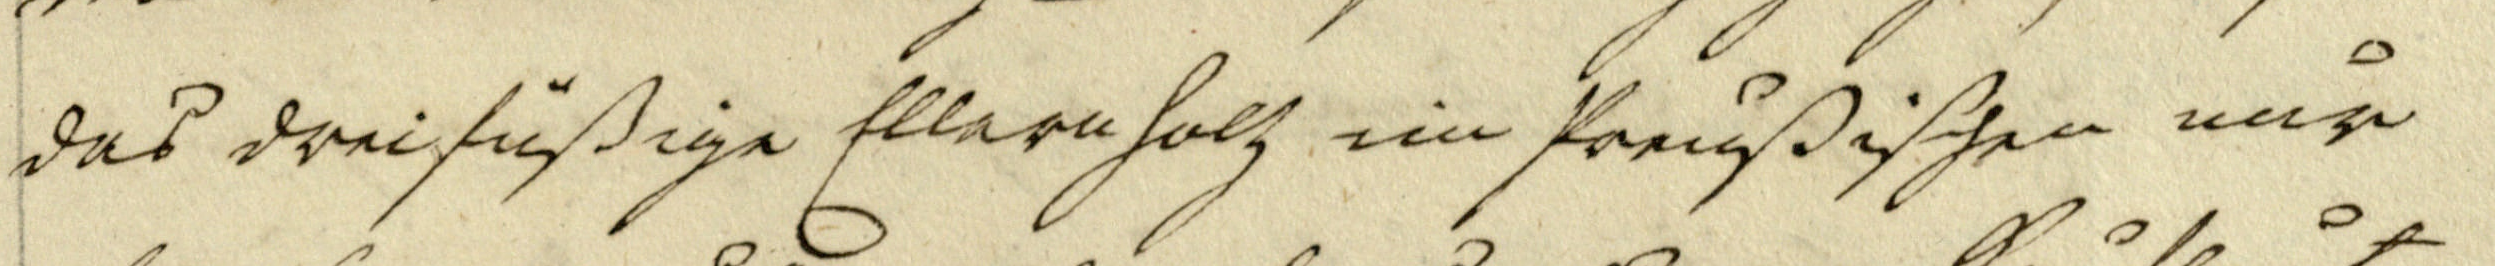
das dreifüßige Ellernholz im Preußischen nur
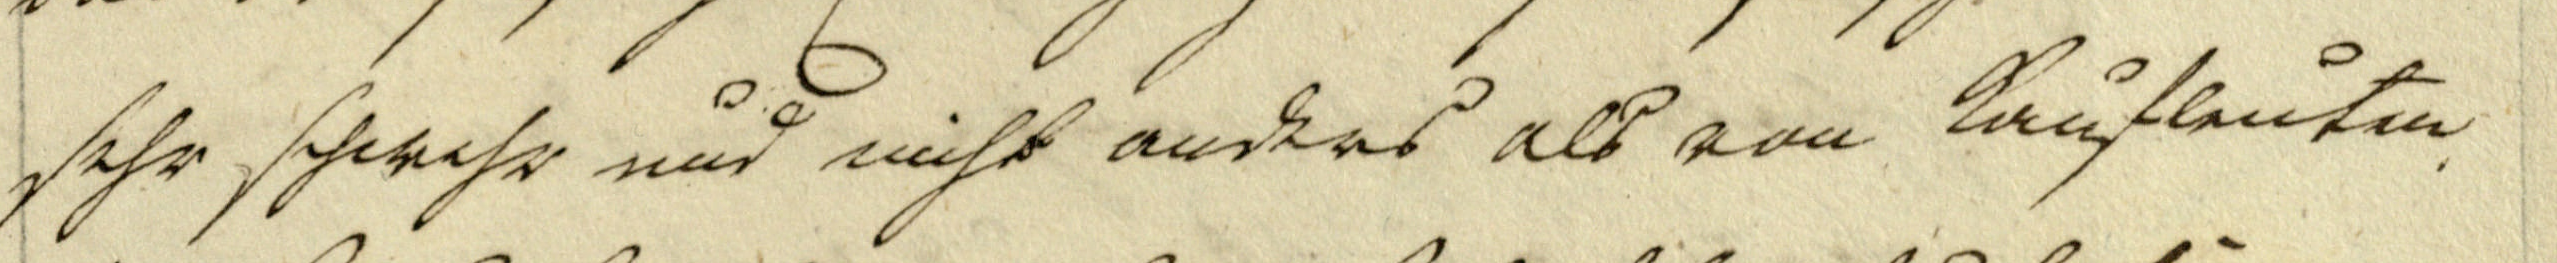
sehr schwehr und nicht anders als von Kaufleuten
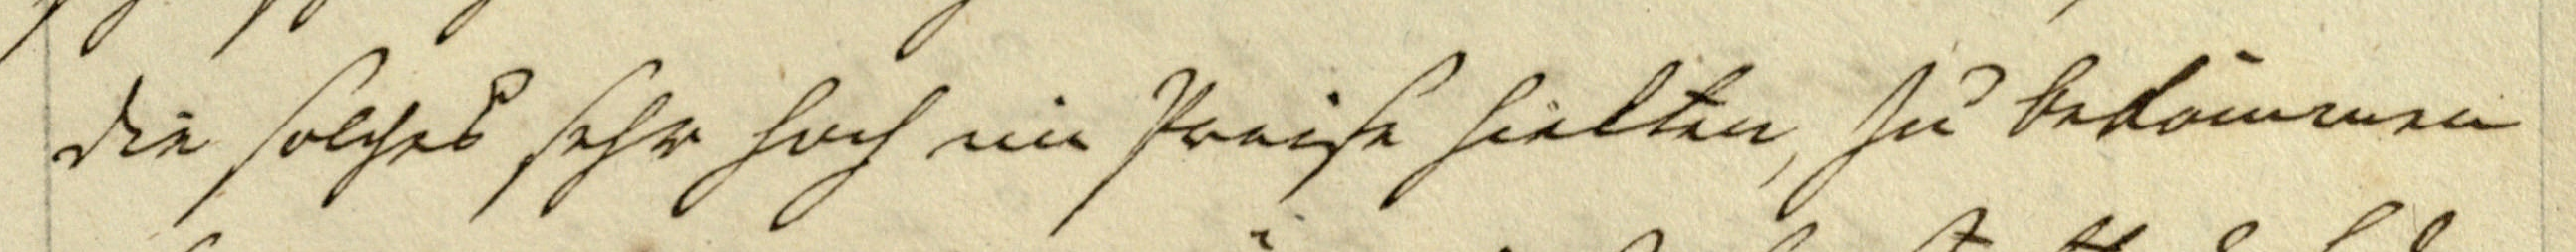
die solches sehr hoch im Preise hielten, zu bekommen
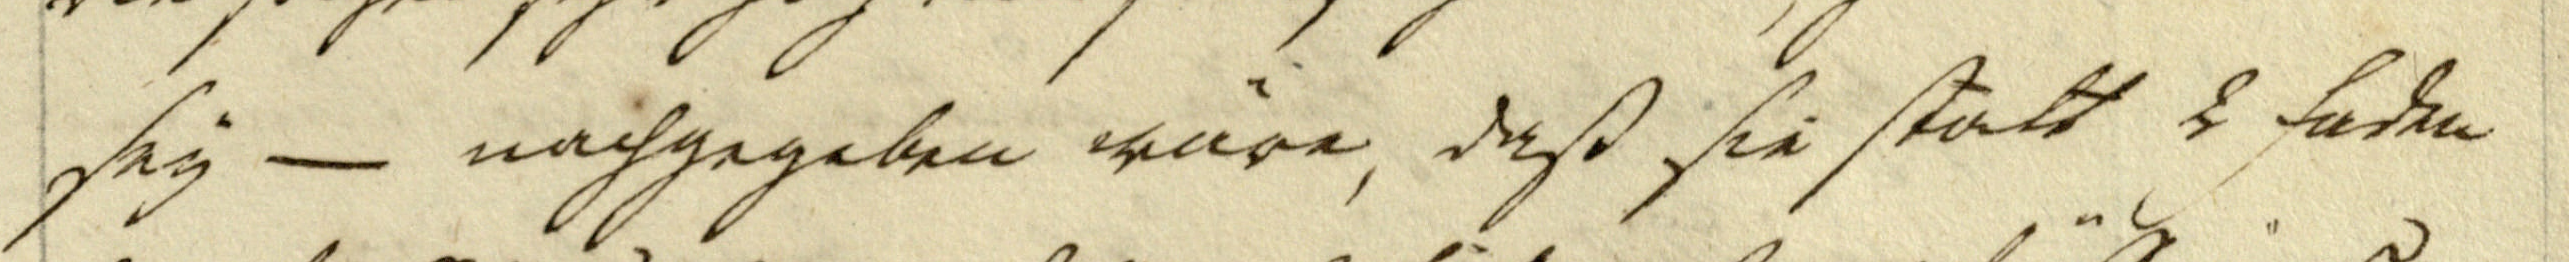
seÿ nachgegeben wäre, daß sie statt 2 Faden
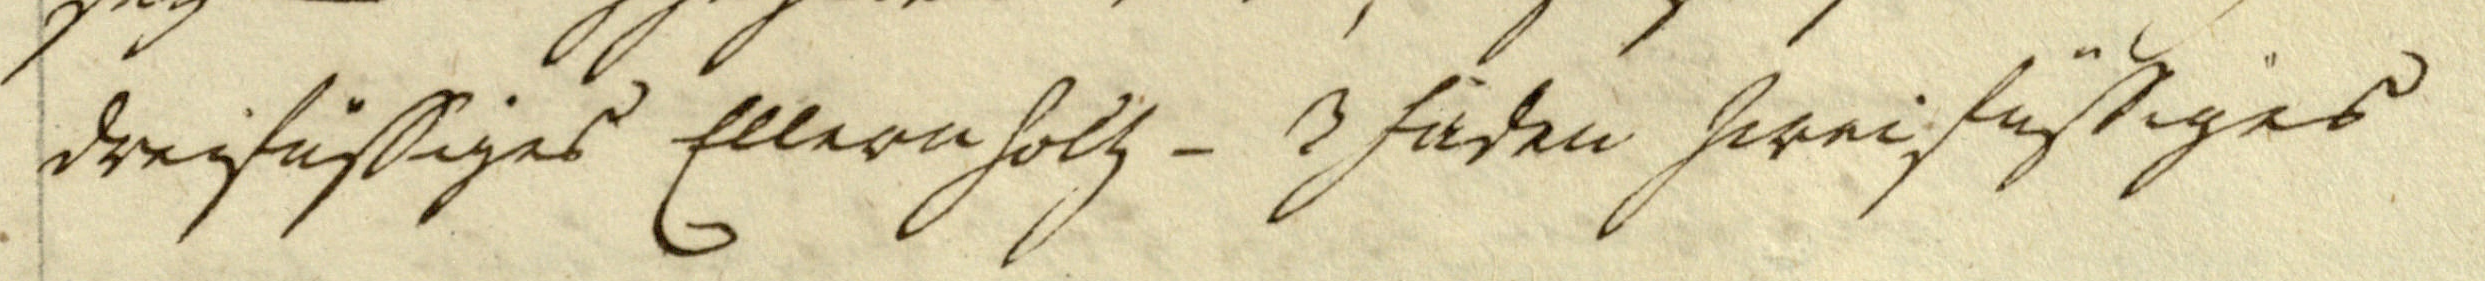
dreifüssiges Ellernholz 3 Faden zweifüssiges
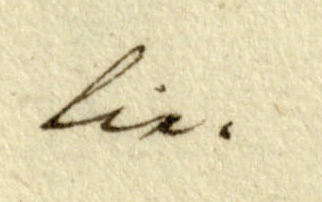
lie
